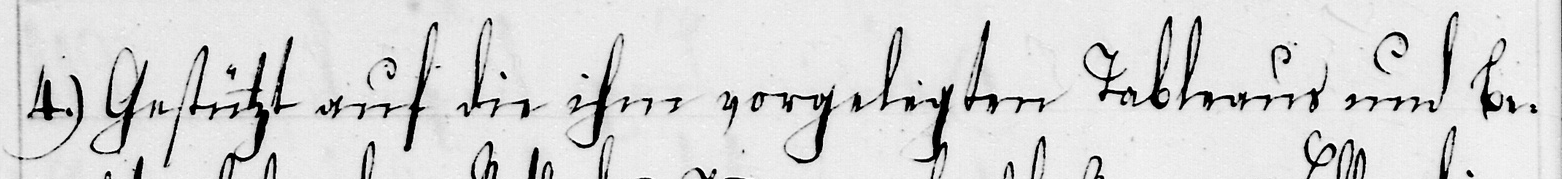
4.) Gestützt auf die ihm vorgelegten Tableaus und Be¬
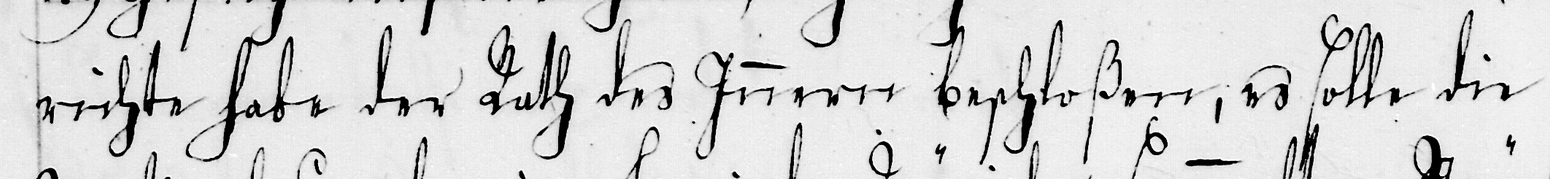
richte habe der Rath des Innern beschloßen, es solle die
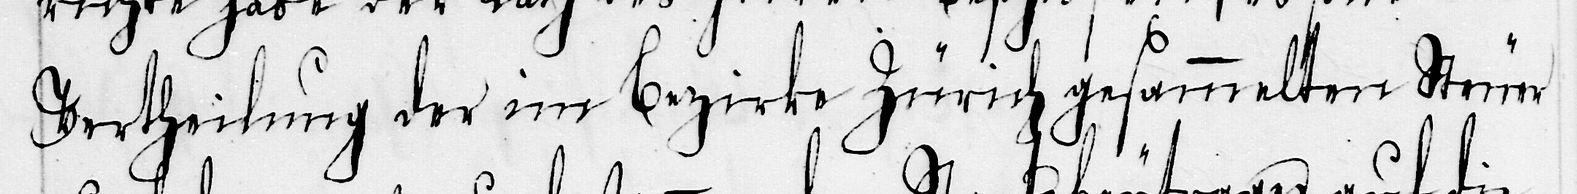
Vertheilung der im Bezirke Zürich gesammelten Steuer
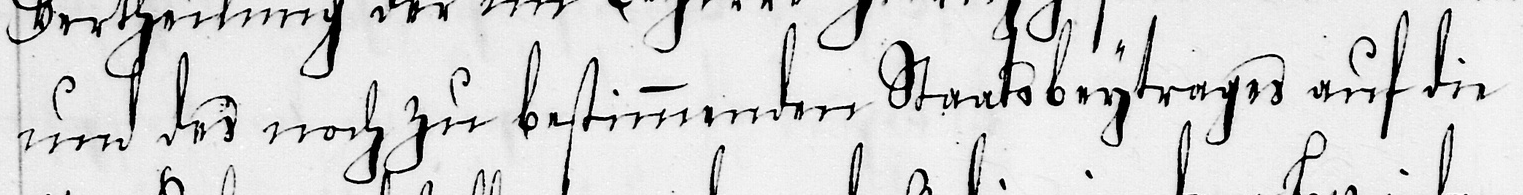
und des noch zu bestimmenden Staatsbeytrages auf die
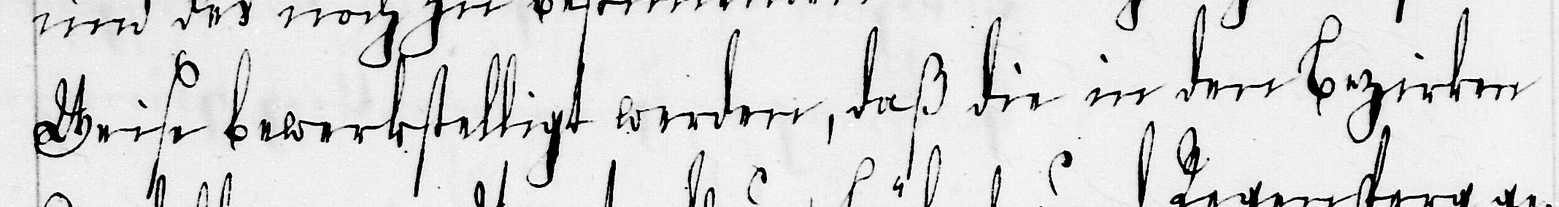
Weise bewerkstelligt werden, daß die in den Bezirken
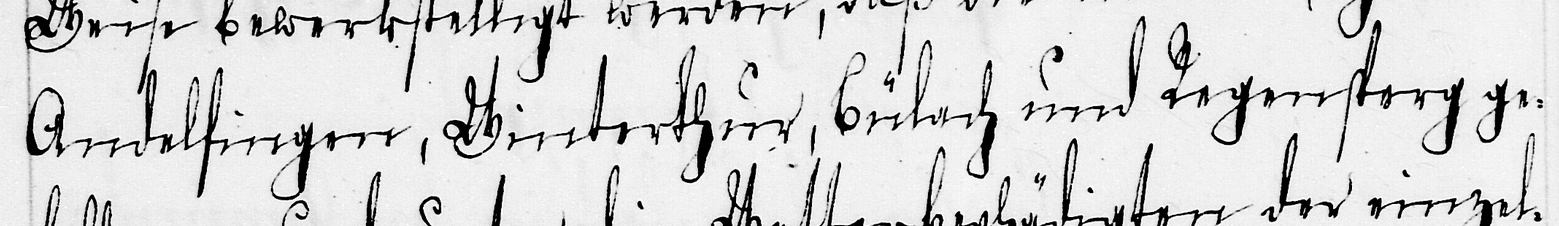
Andelfingen, Winterthur, Bülach und Regensperg ge¬
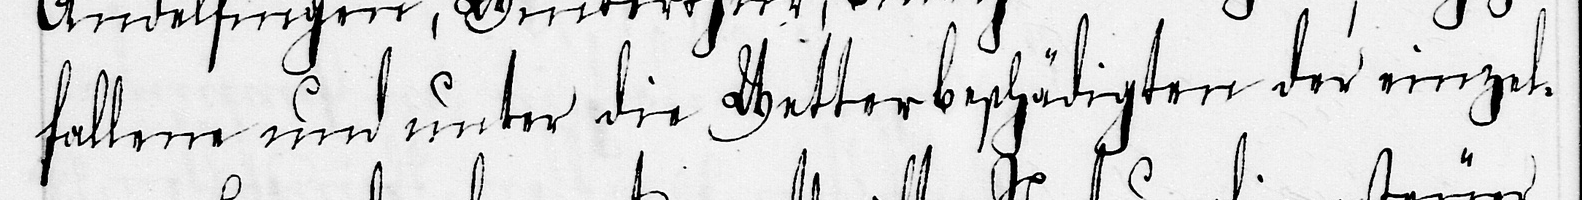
fallene und unter die Wetterbeschädigten der einzel¬
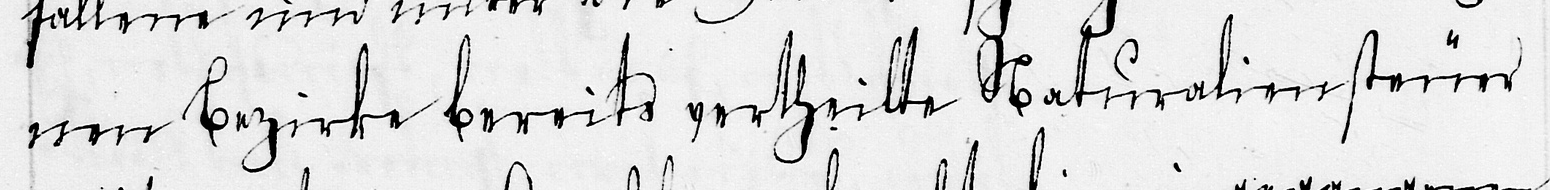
nen Bezirke bereits vertheilte Naturaliensteuer
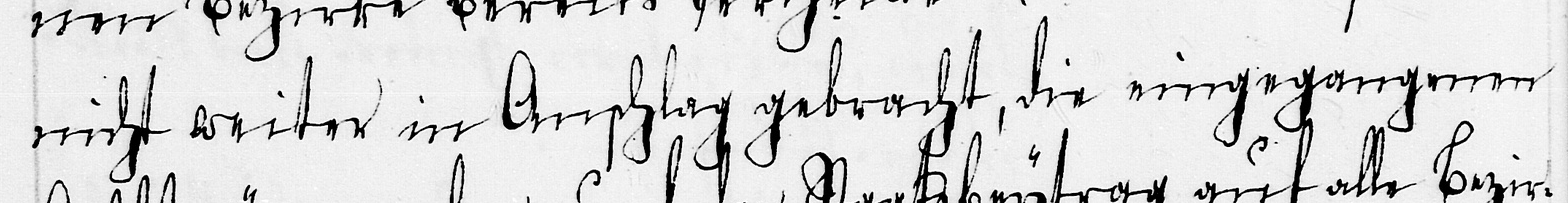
nicht weiter in Anschlag gebracht, die eingegangenen
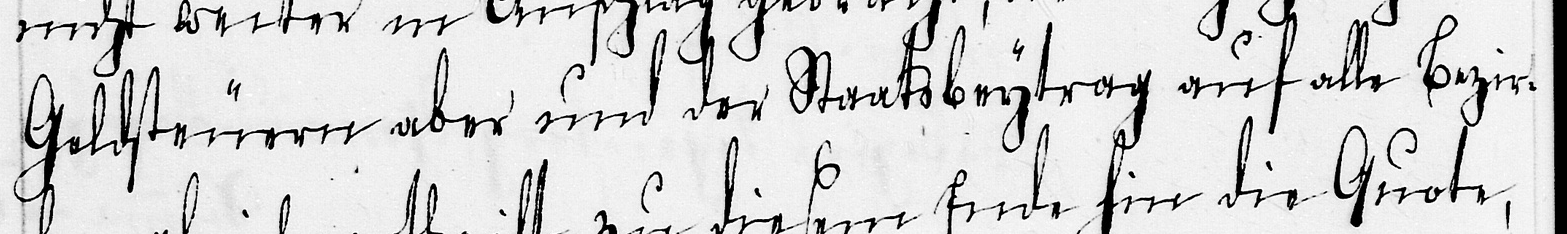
Geldsteuern aber und der Staatsbeytrag auf alle Bezir¬
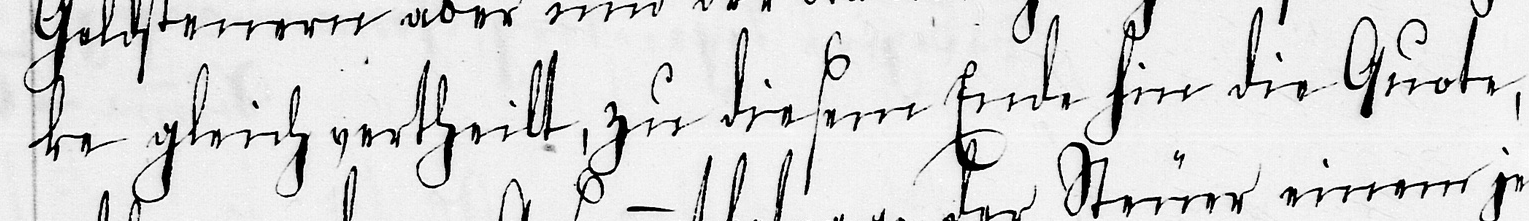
ke gleich vertheilt, zu diesem Ende hin die Quote,
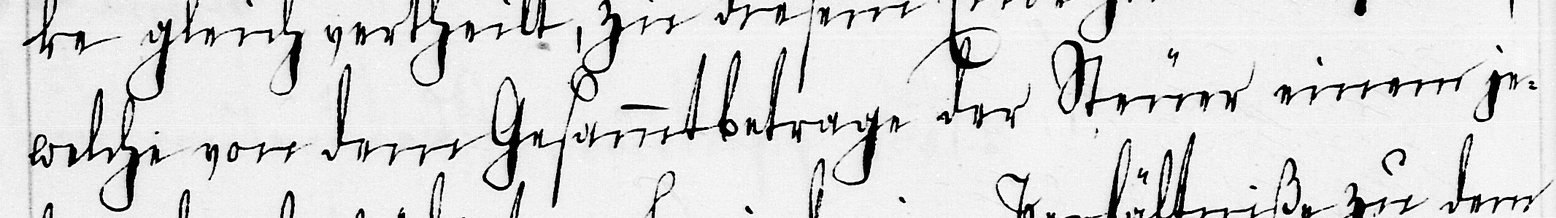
welche von dem Gesammtbetrage der Steuer einem je¬
